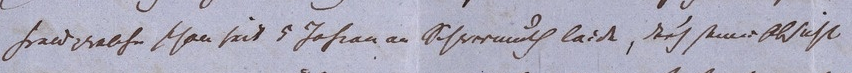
Frau welche schon seit 5 Jahren an Schwermuth leide, durch seine Absicht
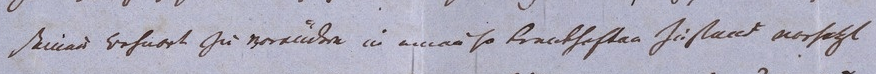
seinen Wohnort zu verändern in einen so krankhaften Zustand versetzt
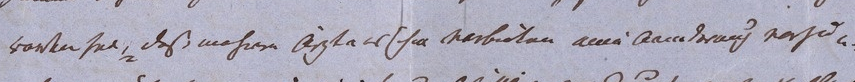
worden sei, daß mehrere Ärzte es ihm verbieten eine Aenderung vorzu-
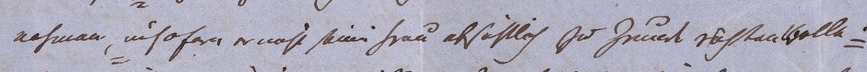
nehmen, «insofern er nicht seine Frau absichtlich zu Grunde richten wolle.»
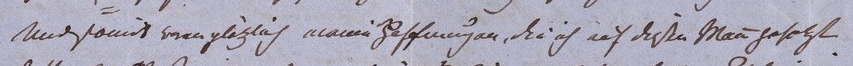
Und somit waren plötzlich meine Hoffnungen, die ich auf diesen Mann gesetzt
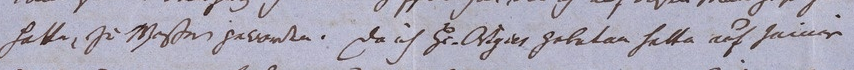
hatte, zu Waßer geworden. Da ich Hr. Ostgies gebeten hatte auf seiner
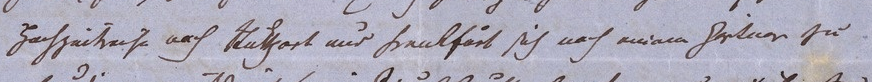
Hochzeitreise nach Stuttgart und Frankfurt sich nach einem Gärtner zu
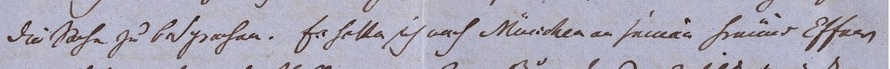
die Sache zu besprechen. Er hatte sich nach München an seinen Freund Effner
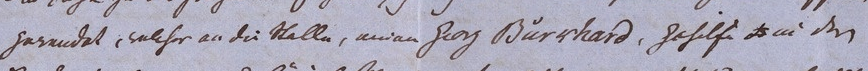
gewendet, welcher an die Stelle, einen Georg Burkhard, Gehilfe in der
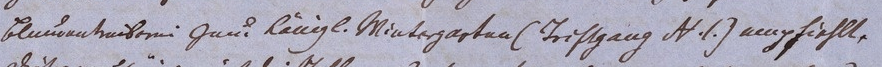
Blumentreiberei zum königl. Wintergarten (Triftgang N. 1.) empfiehlt.
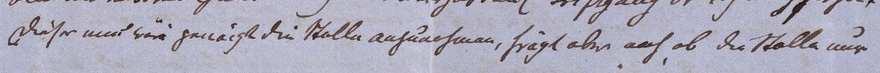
Dieser nun wäre geneigt die Stelle anzunehmen, frägt aber nach, ob die Stelle nur
